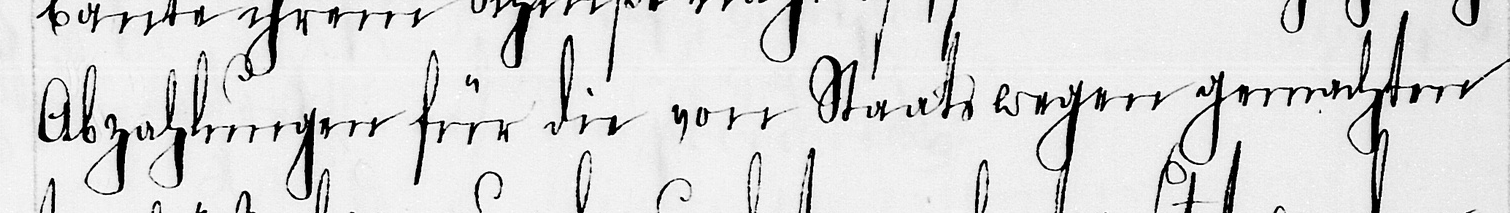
Abzahlungen für die von Staatswegen gemachten
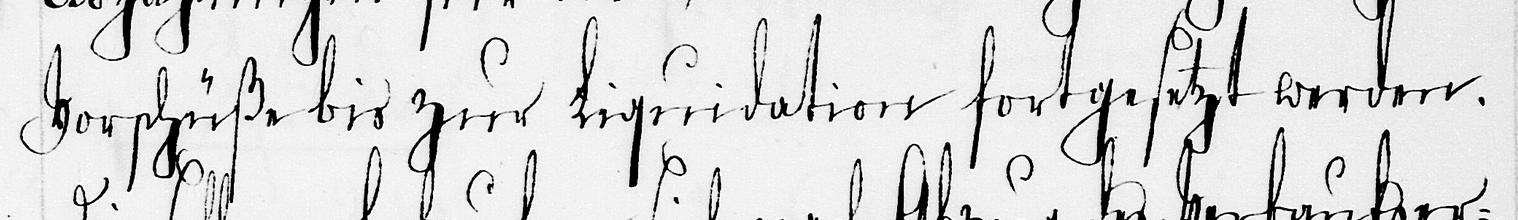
Vorschüße bis zur Liquidation fortgesetzt werden.
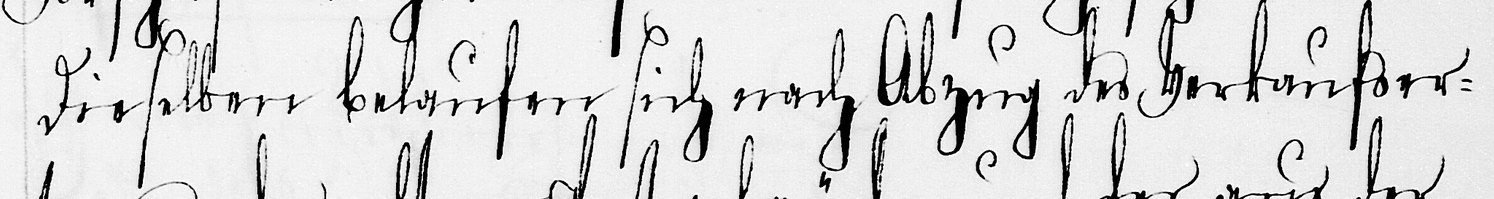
Dieselben belaufen sich nach Abzug des Verkaufser¬
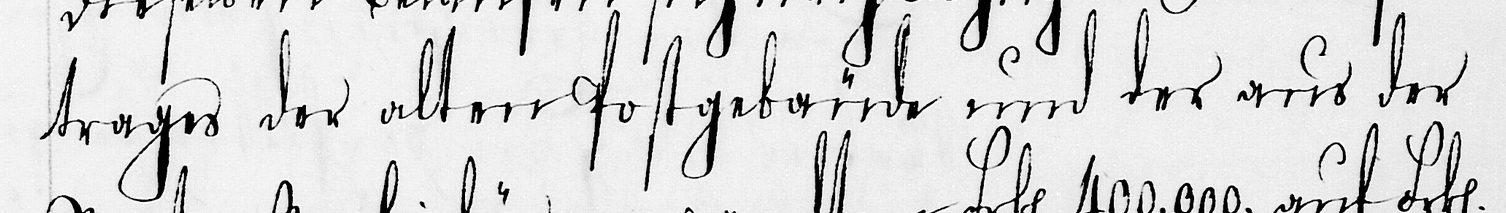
trages der alten Postgebäude und der aus der
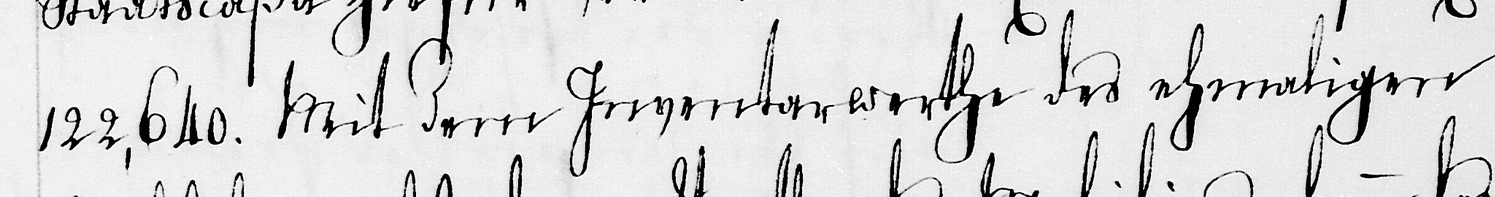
122,640. Mit dem Inventarwerthe des ehemaligen
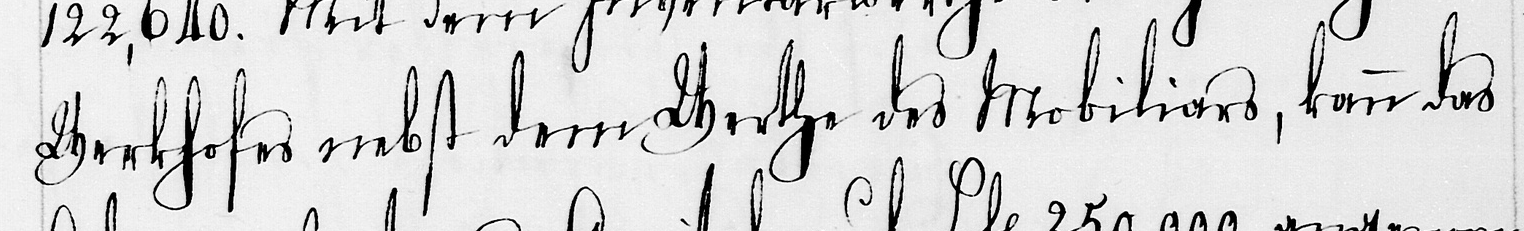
Werkhofes nebst dem Werthe des Mobiliars, kann das
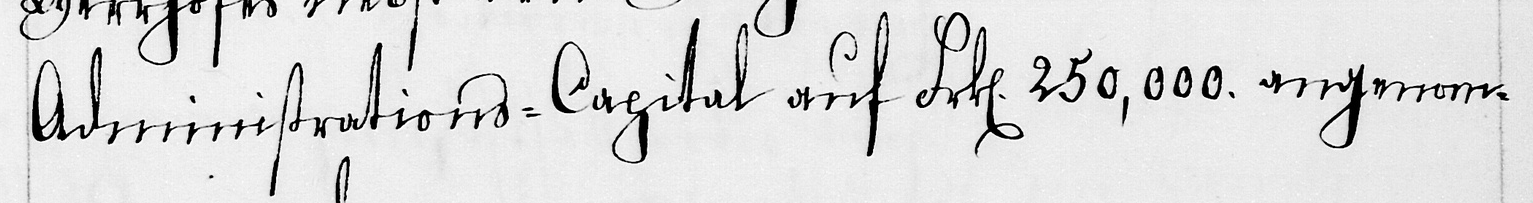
Administrations-Capital auf Frk[en]. 250,000. angenom¬
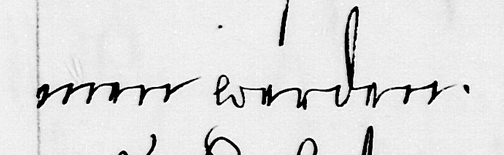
men werden.
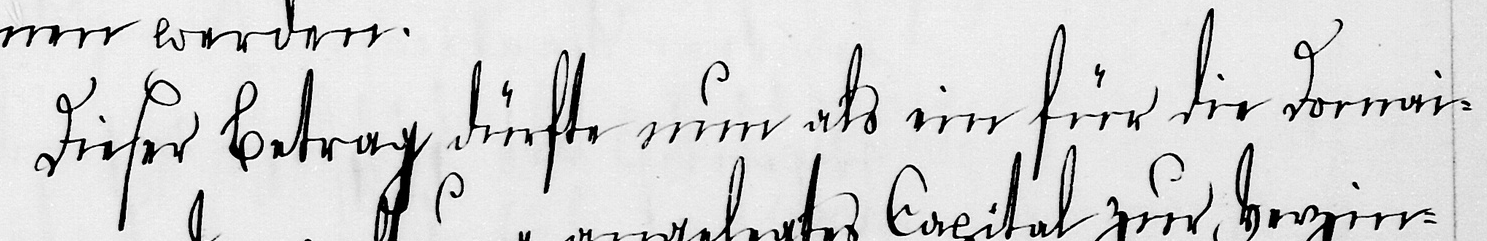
Dieser Betrag dürfte nun als ein für die Domai¬
